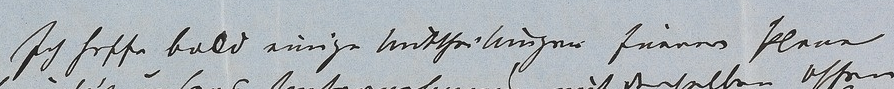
Ich hoffe bald einige Mittheilungen Euerer Pläne
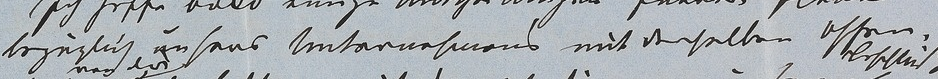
bezüglich unsers Unternehmens mit derselben Offen-
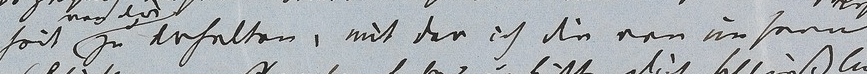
dir zu erhalten, mit der ich dir von unsern
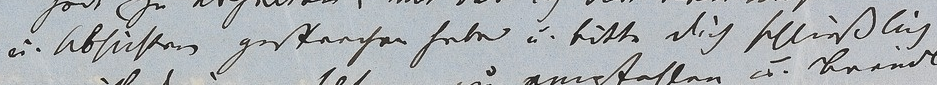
u. Absichten gesprochen habe u. bitte dich schließlich
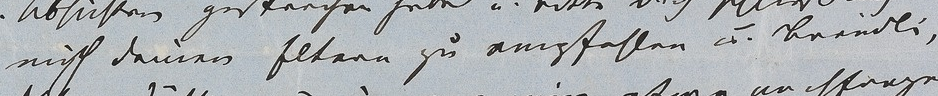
mich deinen Eltern zu empfehlen u. Brändli,
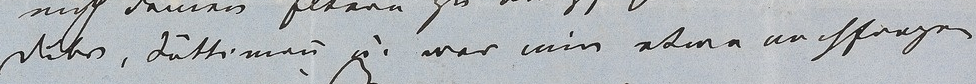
Dubs, Rüttimann u. wer mir etwa nachfragen
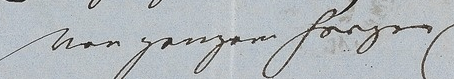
Von ganzem Herzen
